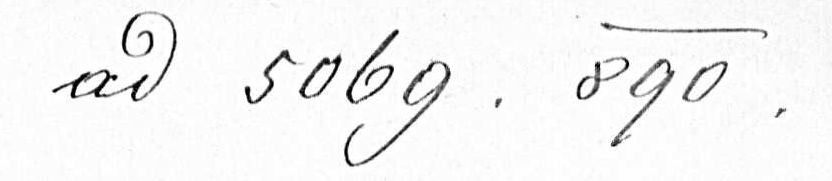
ad 5069. 890.
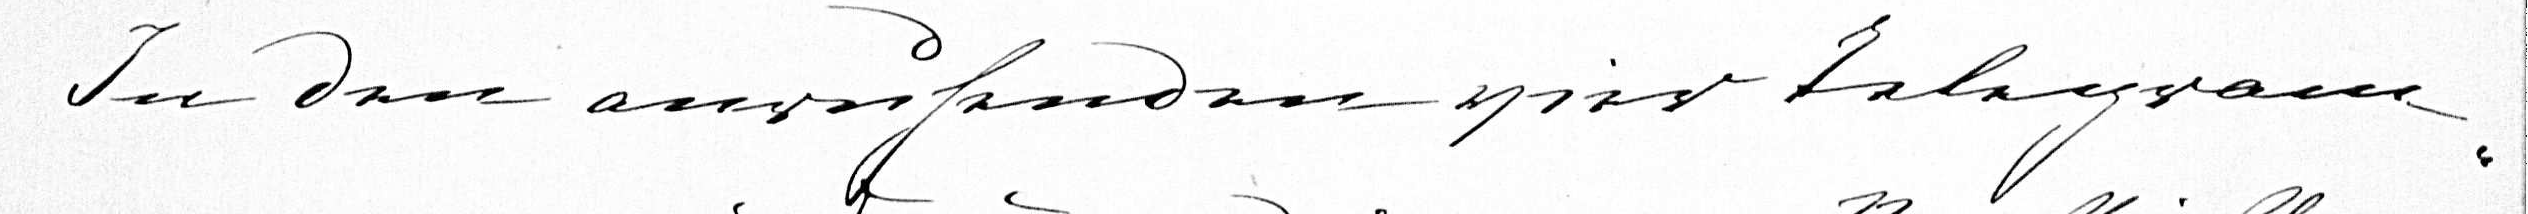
In den anruhenden vier Telegram¬
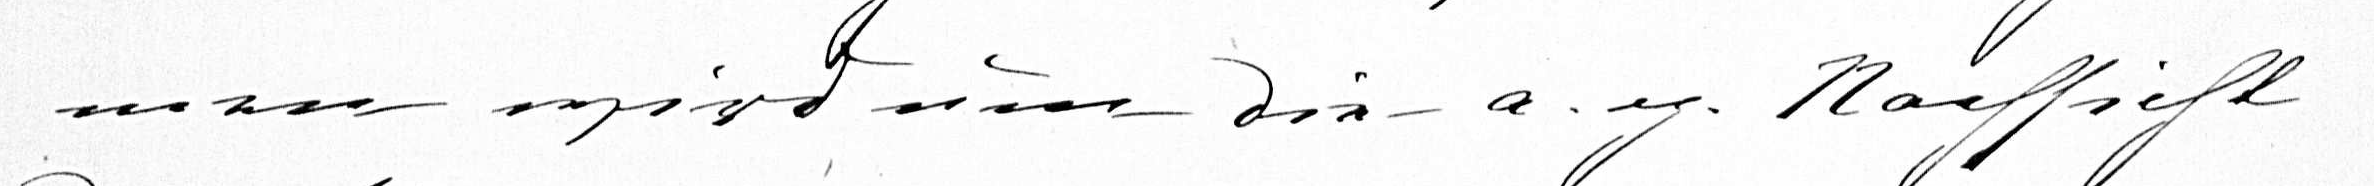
men wird um die a. g. Nachsicht
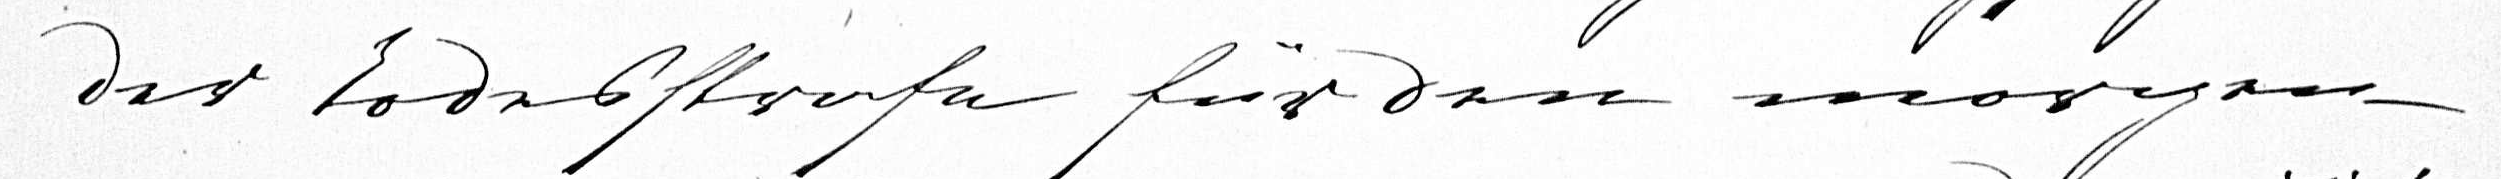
der Todesstrafe für den morgen
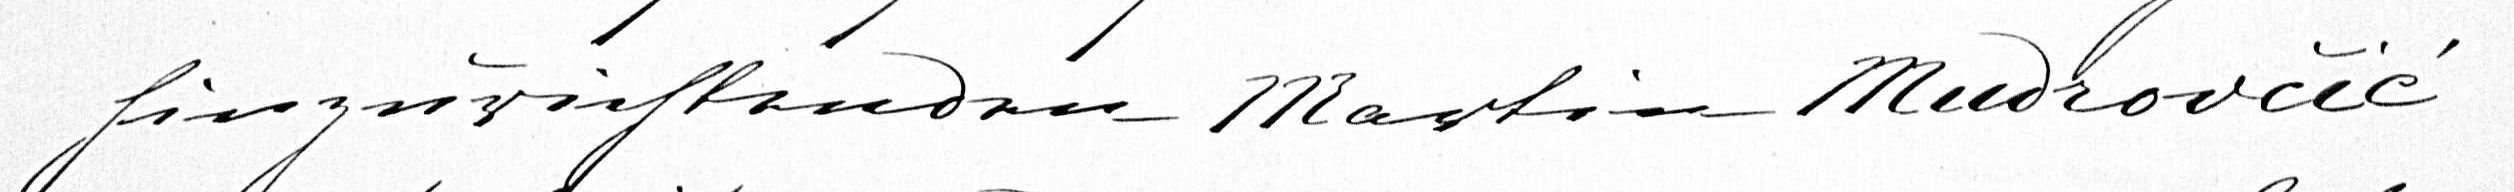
hinzurichtenden Martin Mudrovčić
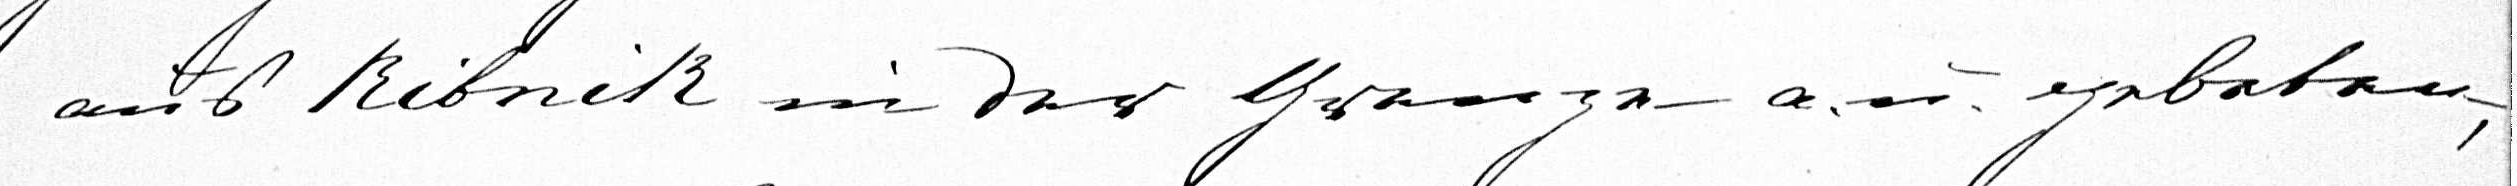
aus Ribnik in der Grenze a. u. gebeten,
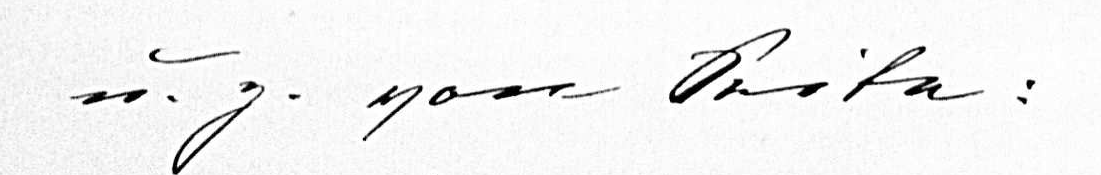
u. z. von Seite:
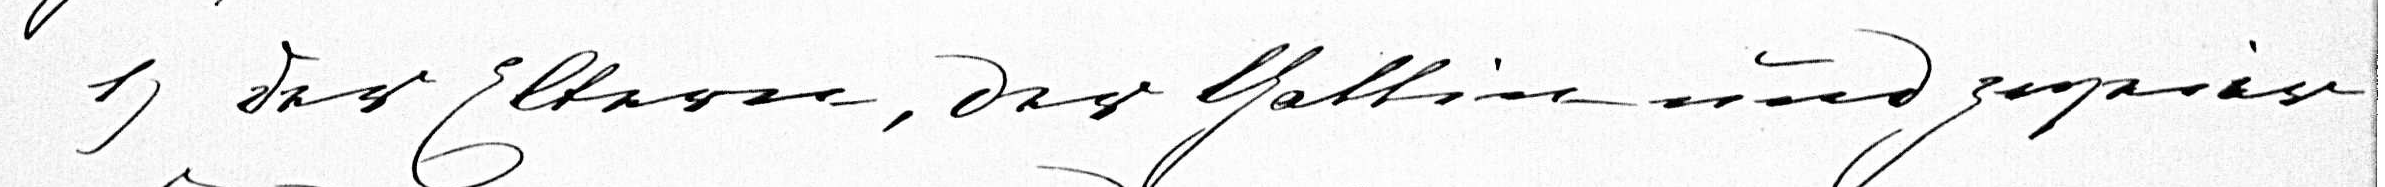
1) der Eltern, der Gattin und zweier
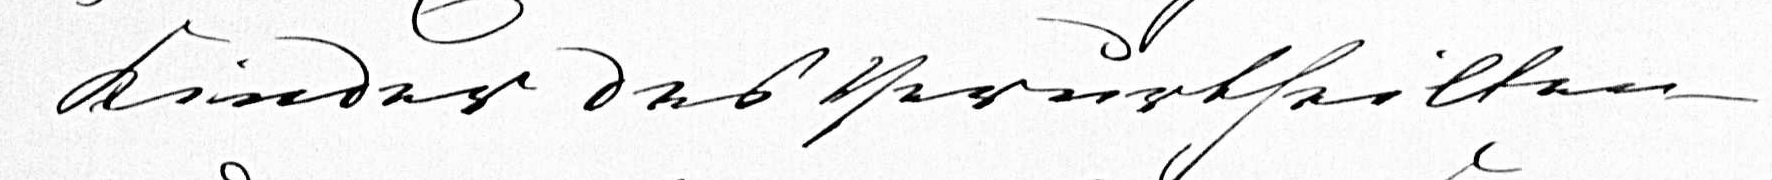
Kinder des Verurtheilten
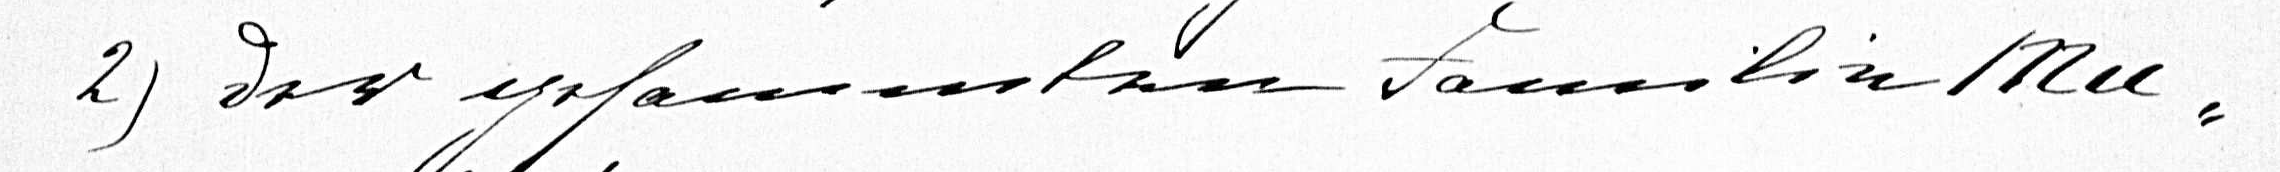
2) der gesammten Familie Mu¬
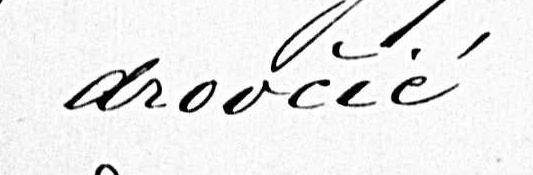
drovčić
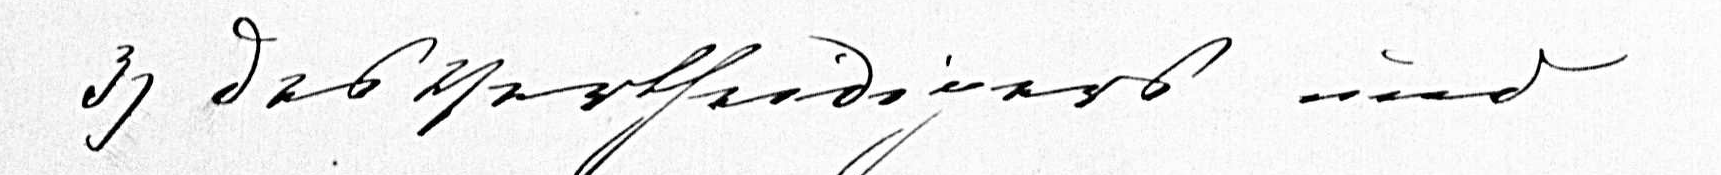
3) des Vertheidigers und
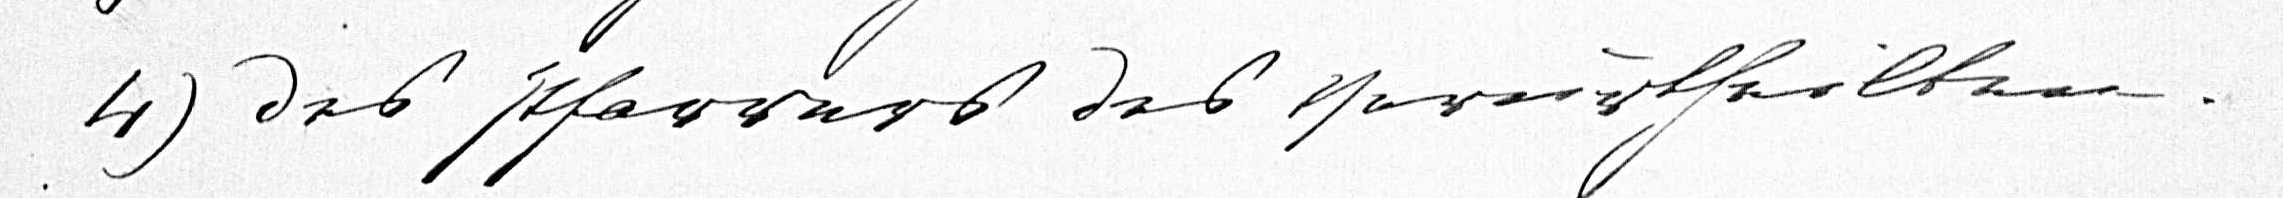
4) des Pfarrers des Verurtheilten.
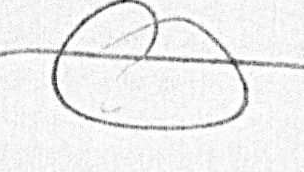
xx
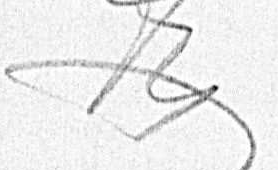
xx
